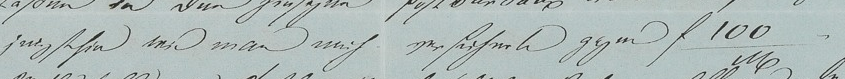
jüngsthin wie man mich versicherte gegen F. 100
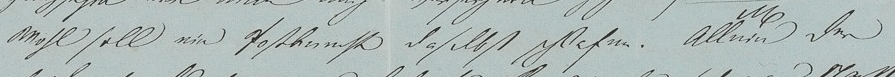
Wohl soll ein Postknecht daselbst schlafen. Allein der
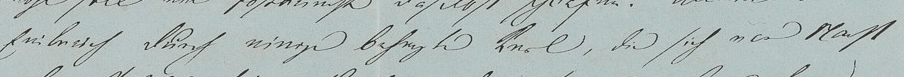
Einbruch durch einige beherzte Kerl, die sich vor Nacht
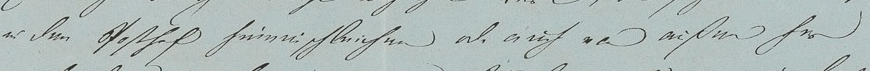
in den Posthof hineinschleichen od. auch von außen her
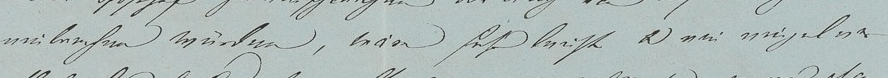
einbrechen würden, wäre sehr leicht & ein einzelner
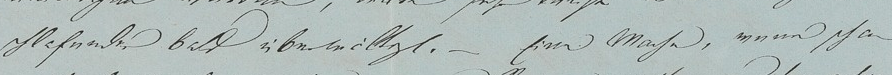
schlafender bald überwältigt. –– Eine Wache, wenn schon
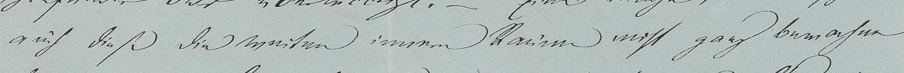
auch diese die weiten innern Räume nicht ganz bewachen
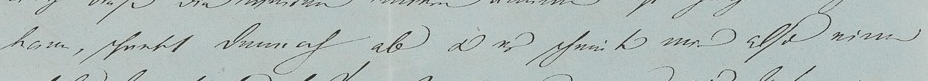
kann, schrekt dennoch ab & es scheint mir also eine
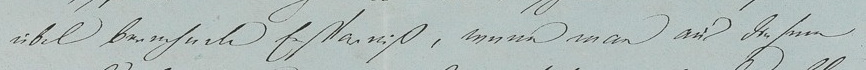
übel berechnete Ersparniß, wenn man aus diesem
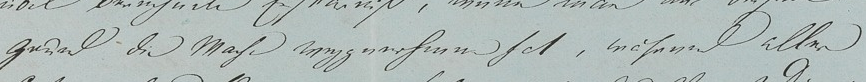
Grund die Wache weggenohmen hat, während aller
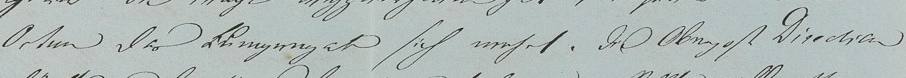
Orten das Lumpenpak sich mehrt. Die Oberpost Direction
